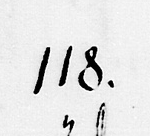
1.
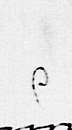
4.
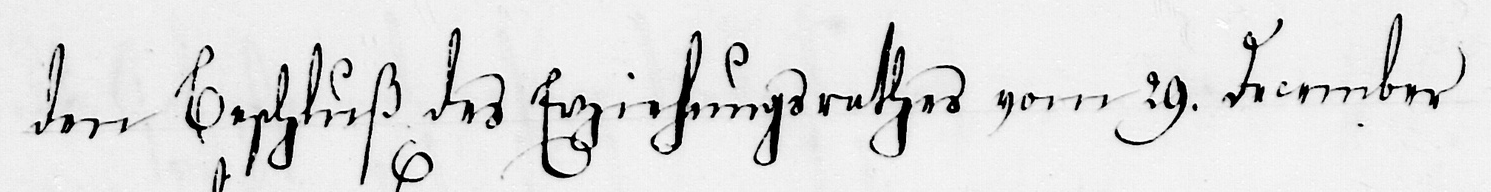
den Beschluß des Erziehungsrathes vom 29. December
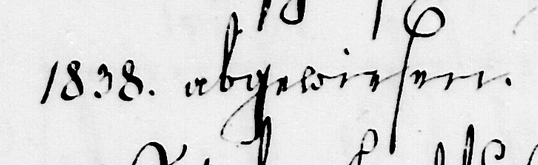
1838. abgewiesen.
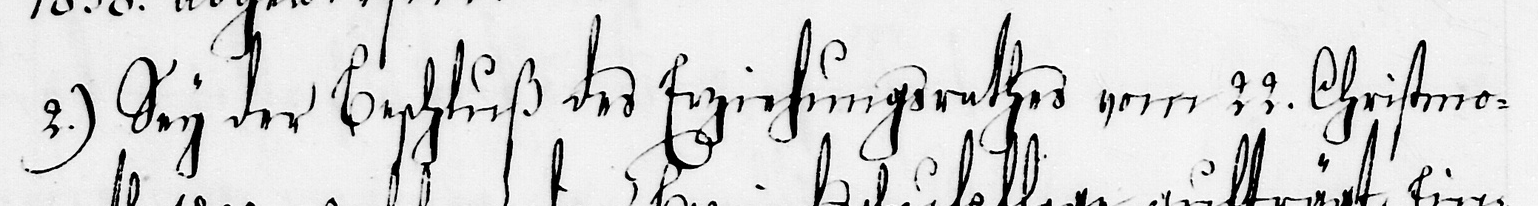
2.) Sey der Beschluß des Erziehungsrathes vom 22. Christmo¬
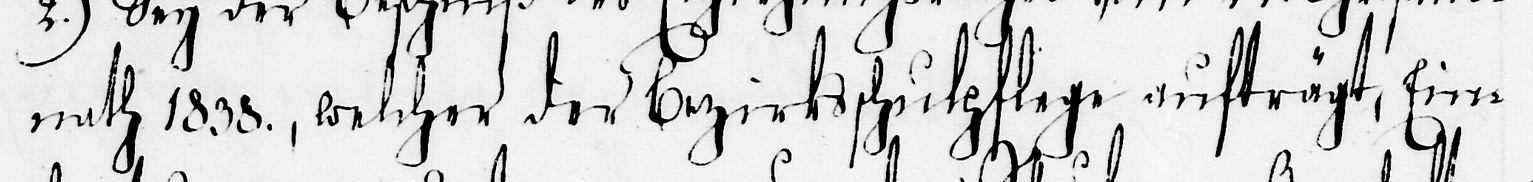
nath 1838., welcher der Bezirksschulpflege aufträgt, Ein¬
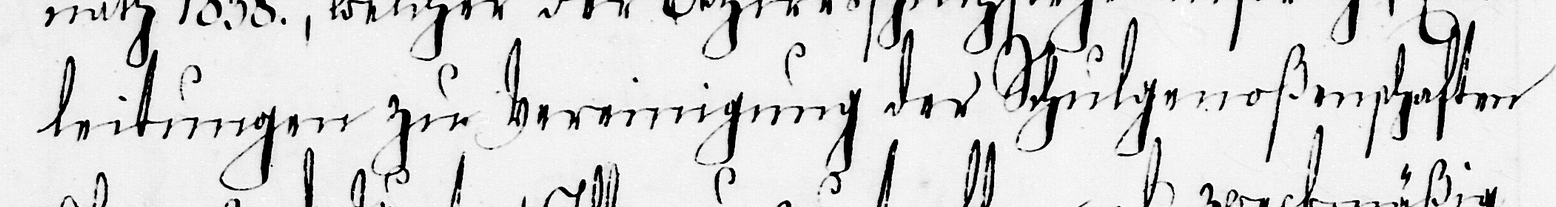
leitungen zu Vereinigung der Schulgenoßenschaften
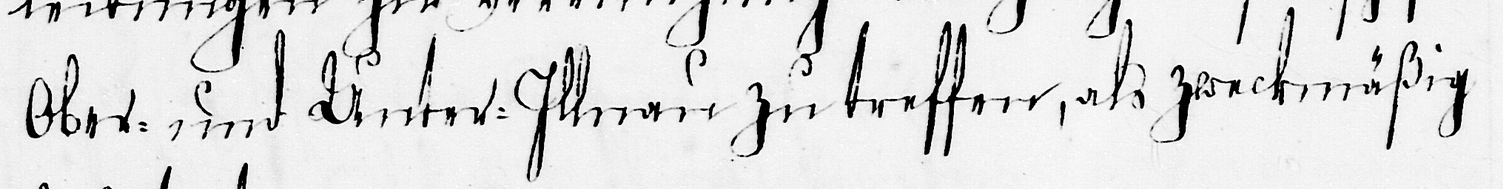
Ober- und Unter-Illnau zu treffen, als zweckmäßig
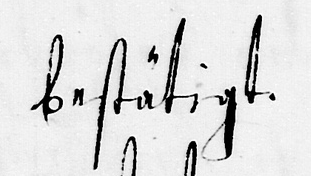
bestätigt.
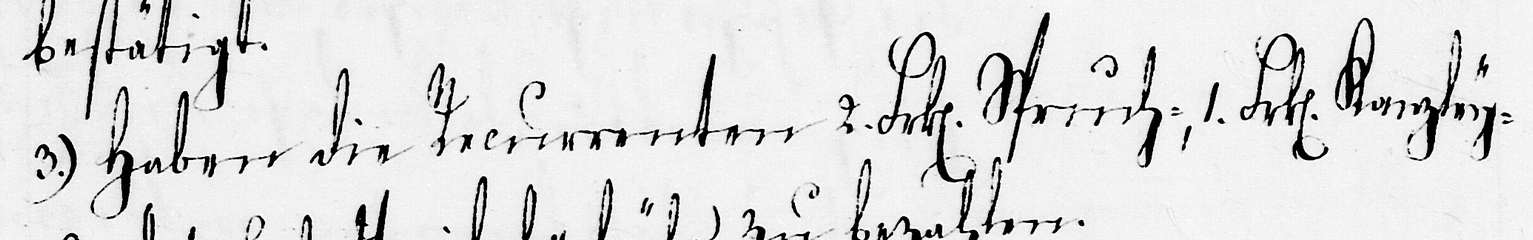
3.) Haben die Recurrenten 2. Frk[en]. Spruch-,
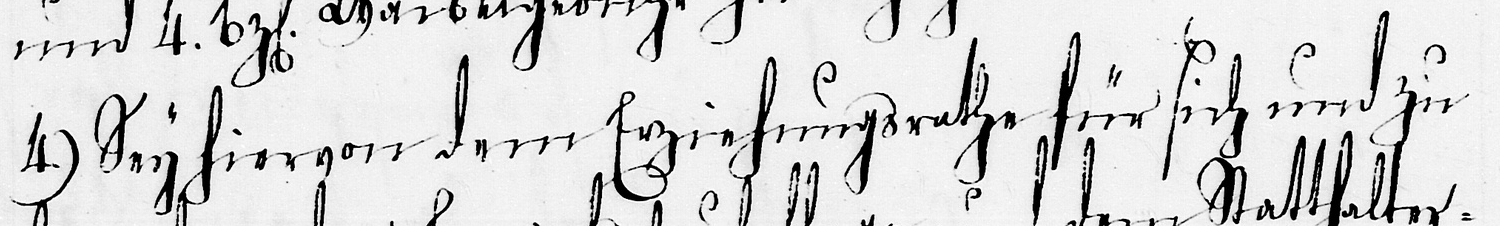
4.) Sey hiervon dem Erziehungsrathe für sich und zu
